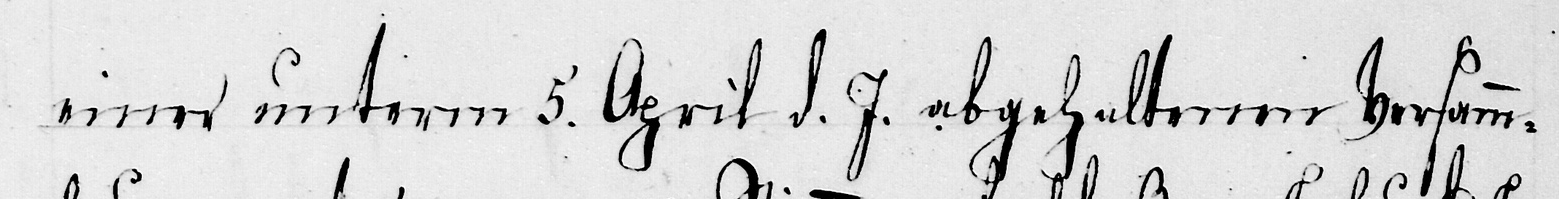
einer unterm 5. April d. J. abgehaltenen Versamm¬
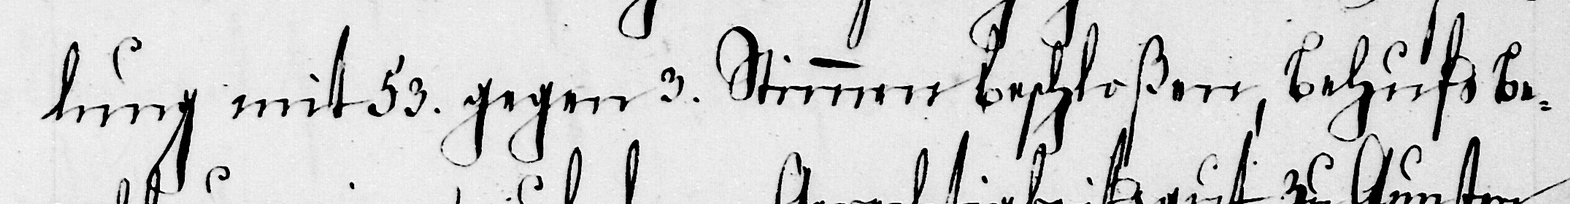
lung mit 53. gegen 3. Stimmen beschloßen, behufs Be¬
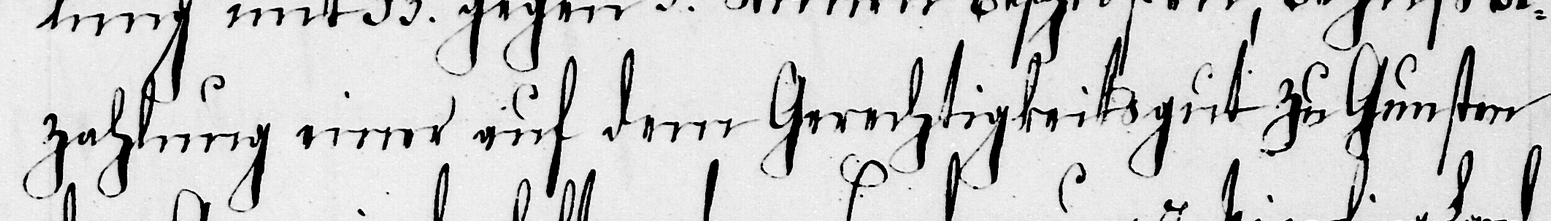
zahlung einer auf dem Gerechtigkeitsgut zu Gunsten
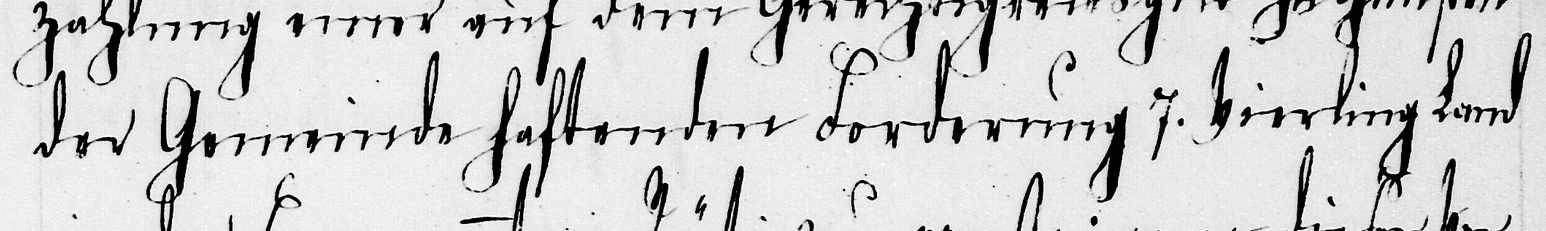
der Gemeinde haftenden Forderung 7. Vierling Land
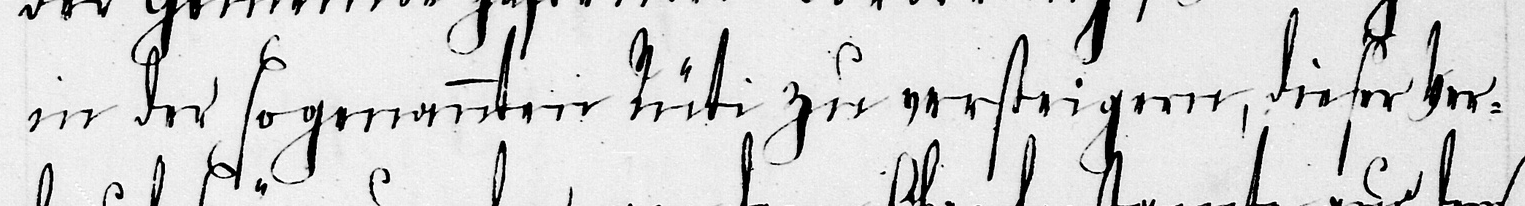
in der sogenannten Rüti zu versteigern, dieser Ver¬
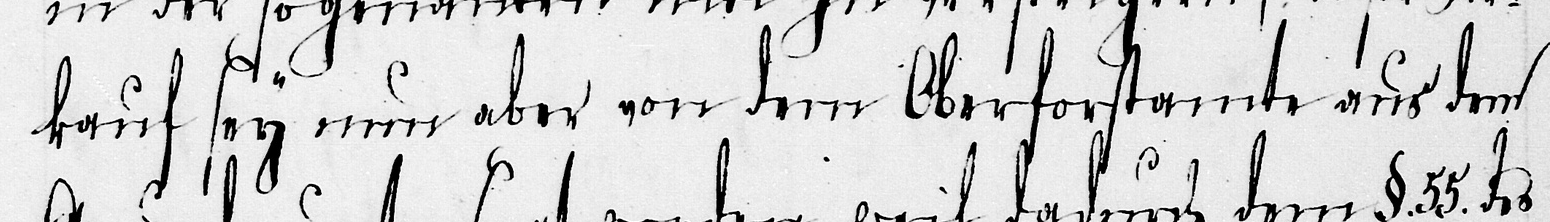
kauf sey nun aber von dem Oberforstamte aus dem
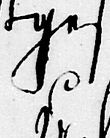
des
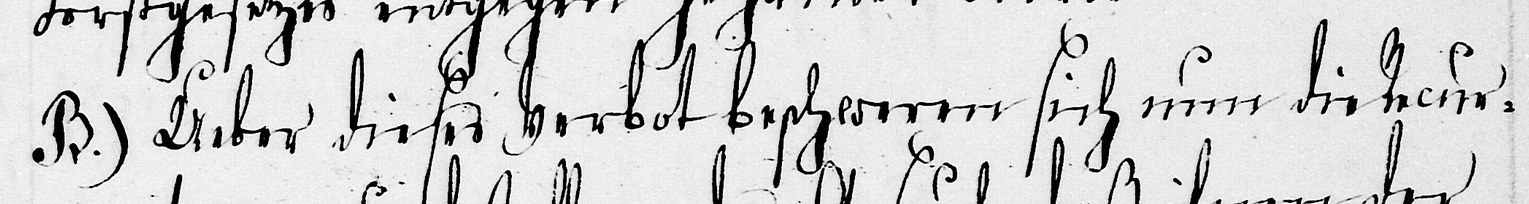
B.) Ueber dieses Verbot beschweren sich nun die Recur¬
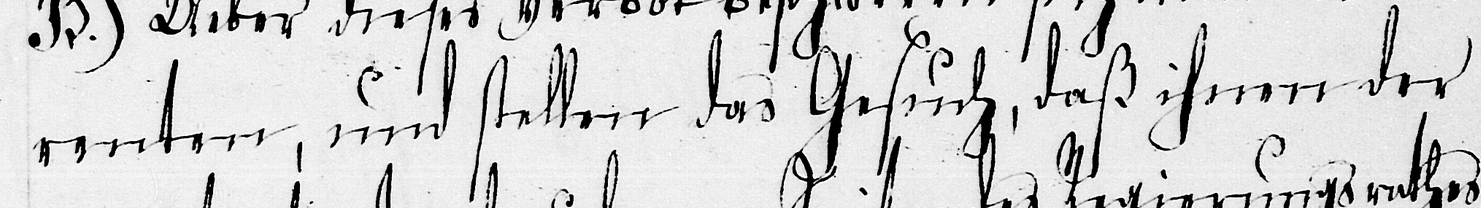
renten, und stellen das Gesuch, daß ihnen der
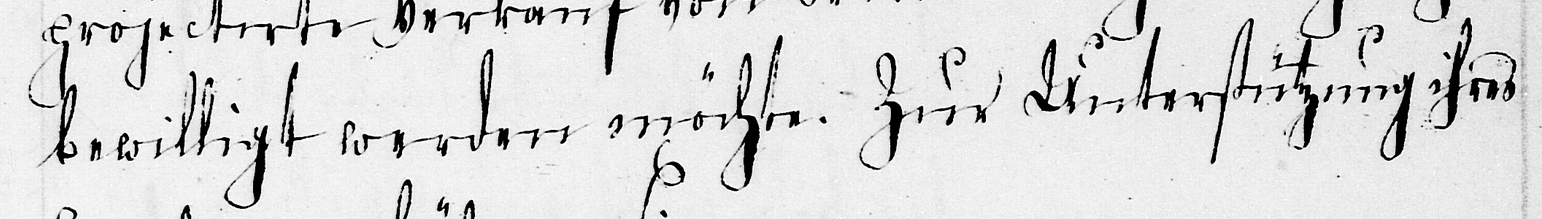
bewilligt werden möchte. Zur Unterstützung ihres
